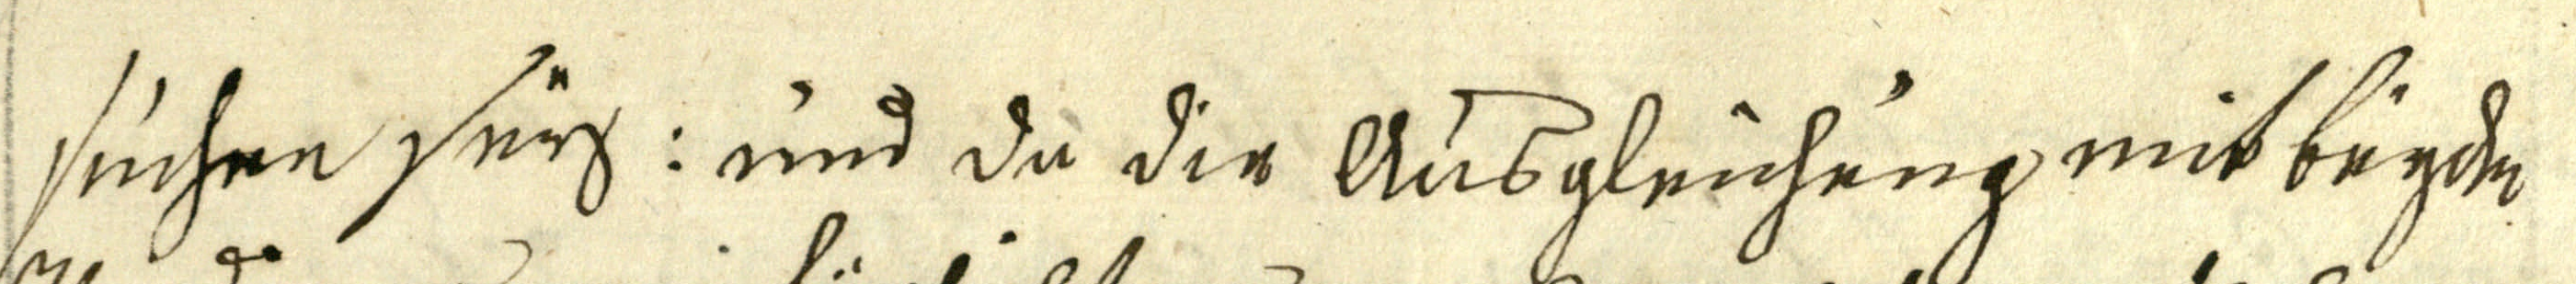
suchen seÿ, und da die Ausgleichung mit beÿden
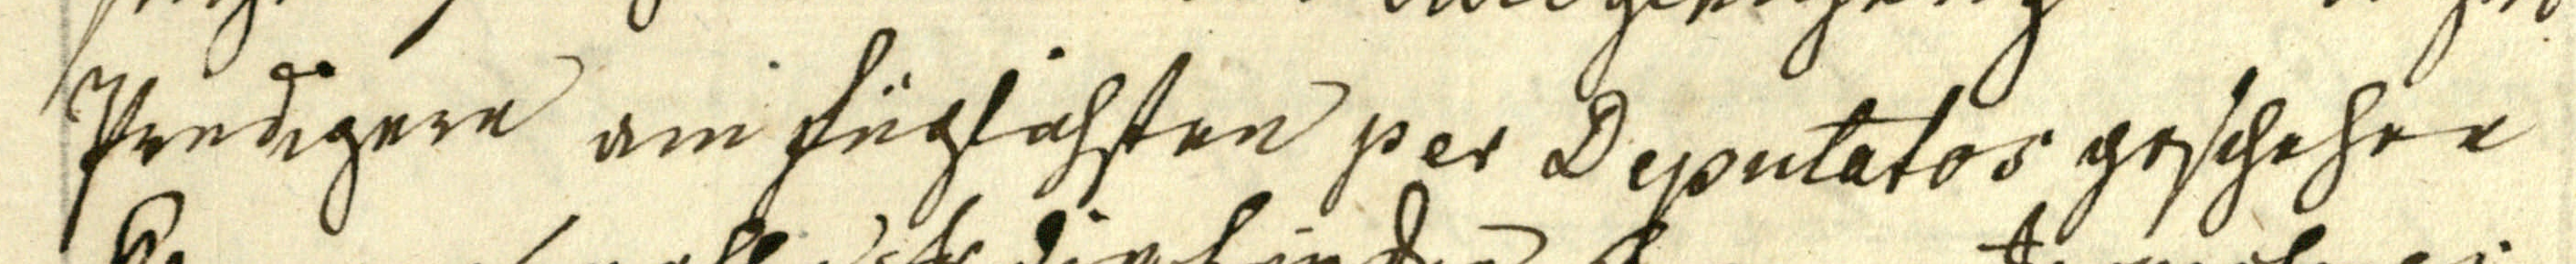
Predigern am füglichsten per Deputatos geschehen
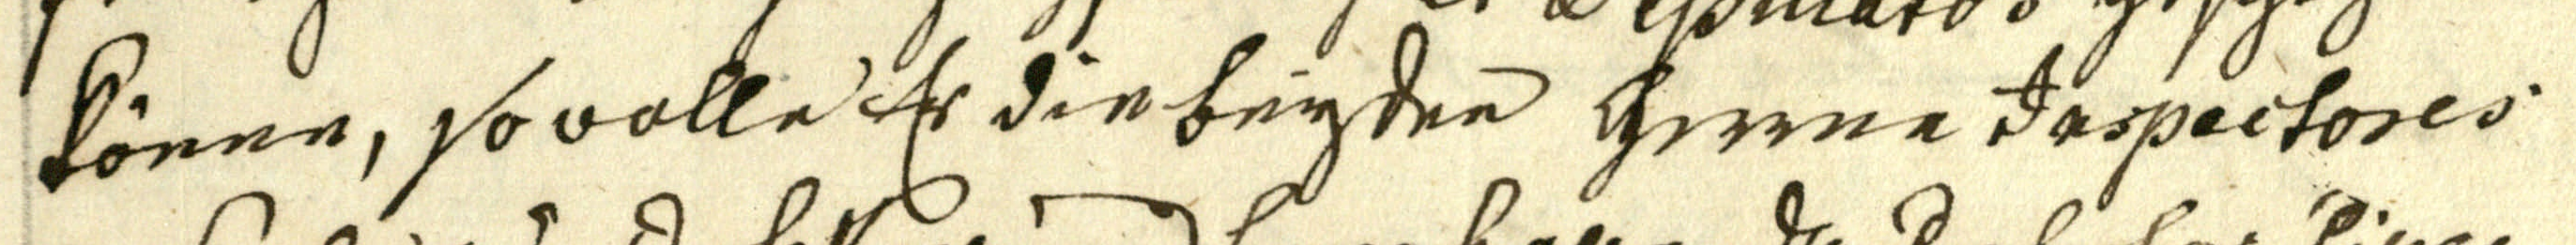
könne, so wolle Er die beÿden Herren Inspectores
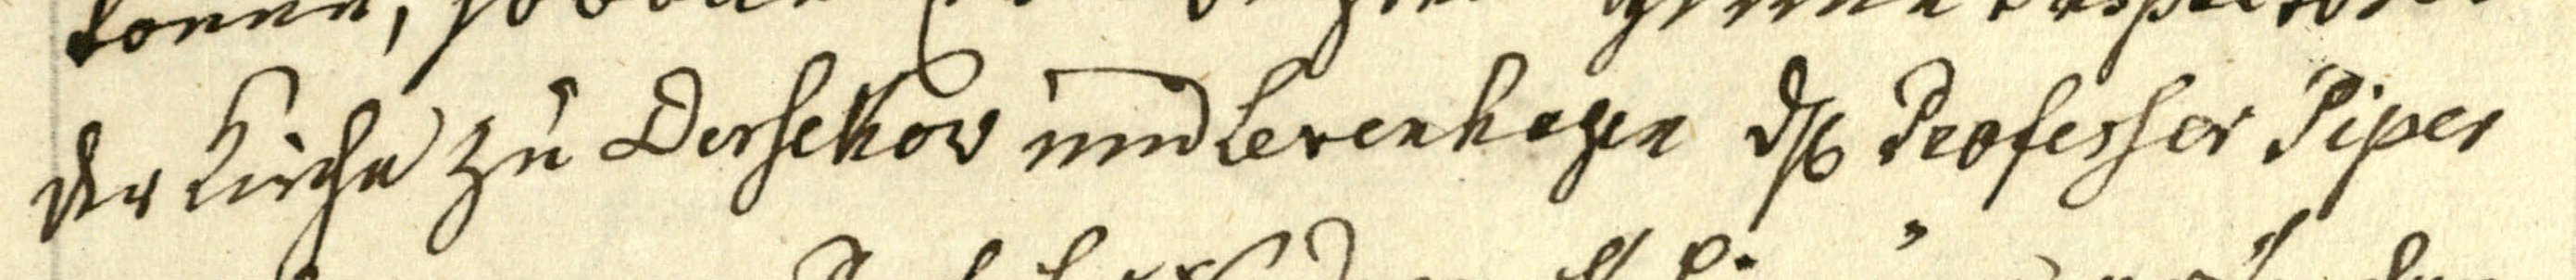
der Kirche zu Dersekow und Levenhagen dh Professor Piper
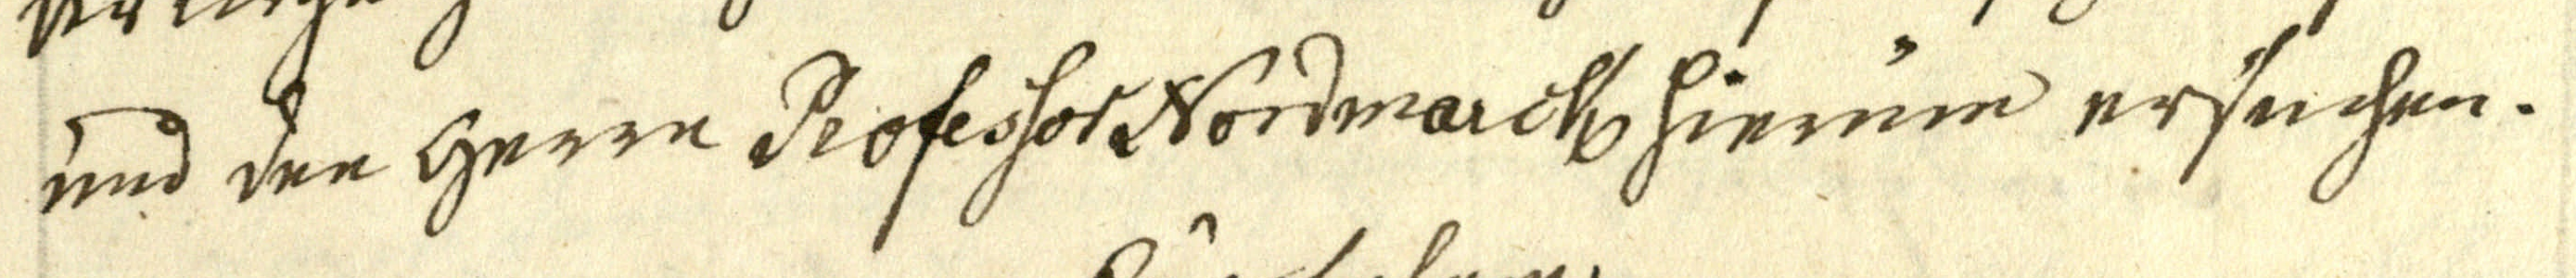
und den Herrn Professor Nordmarck hierum ersuchen.
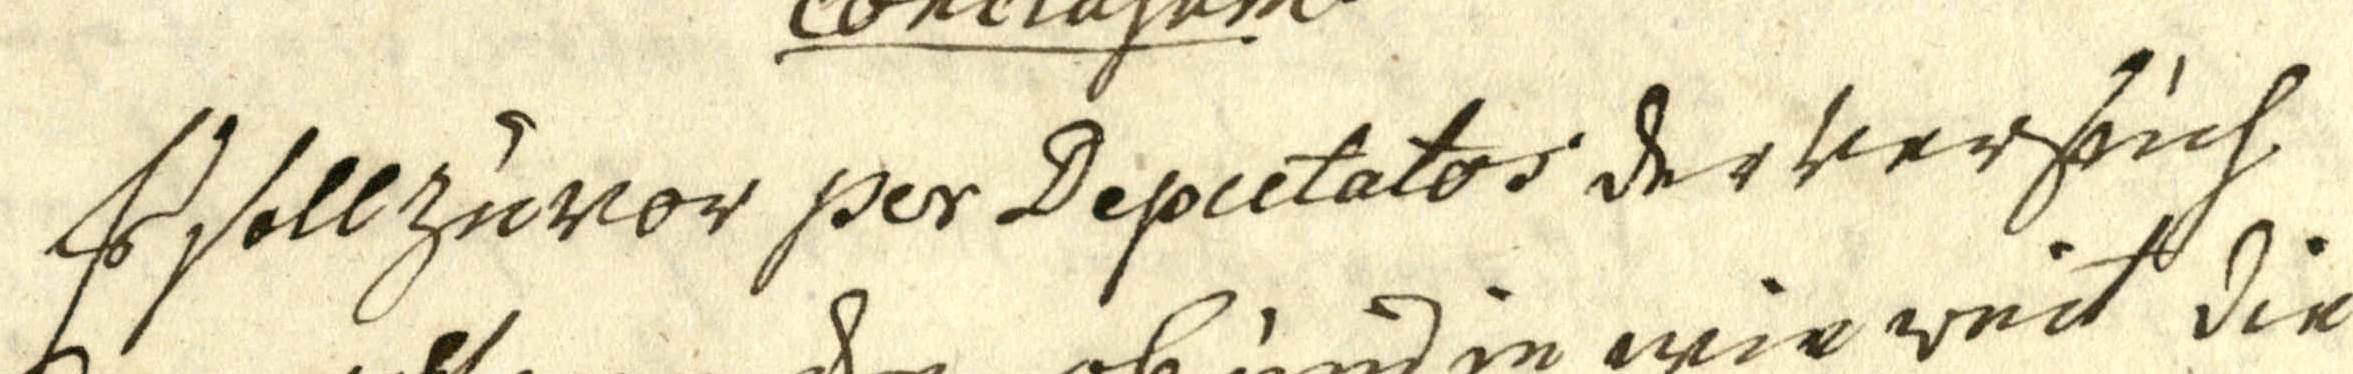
Es soll zuvor per Deputatos der Versuch
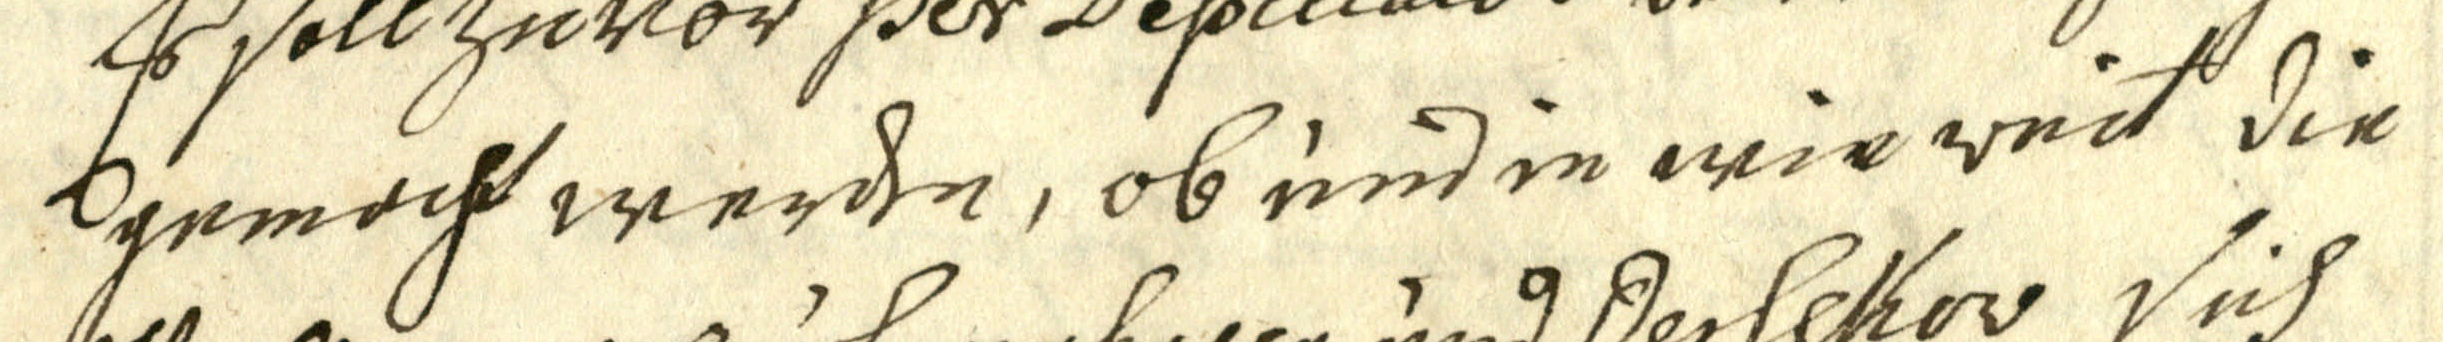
gemacht werden, ob und in wie weit die
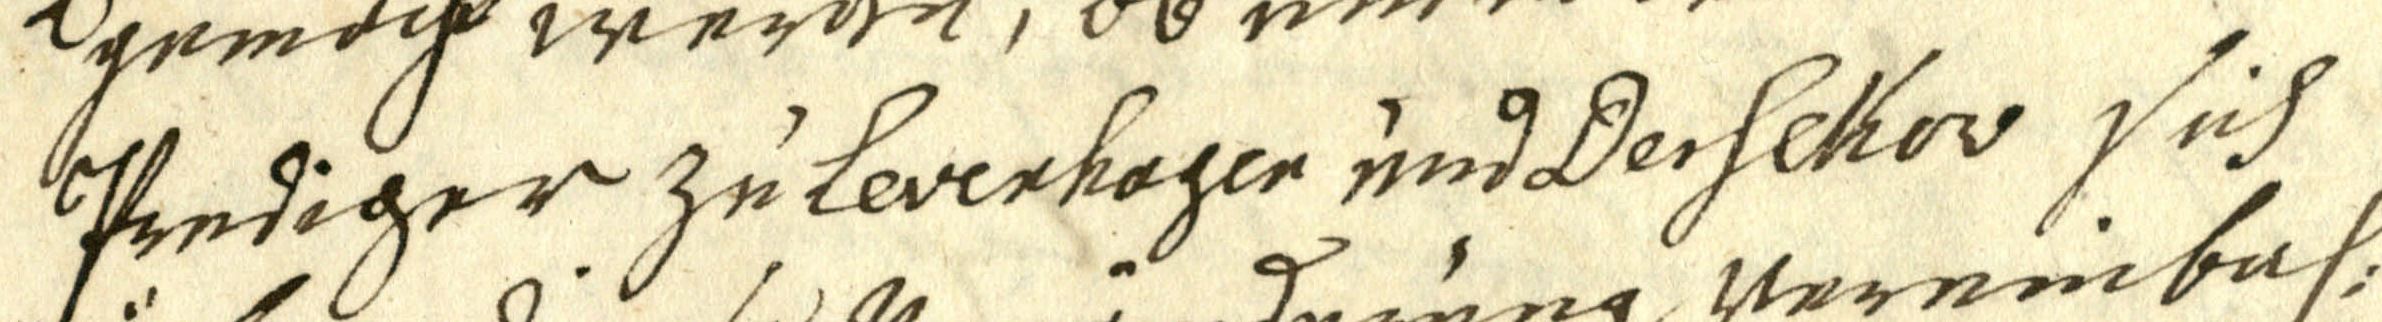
Prediger zu Levenhagen und Dersekow sich
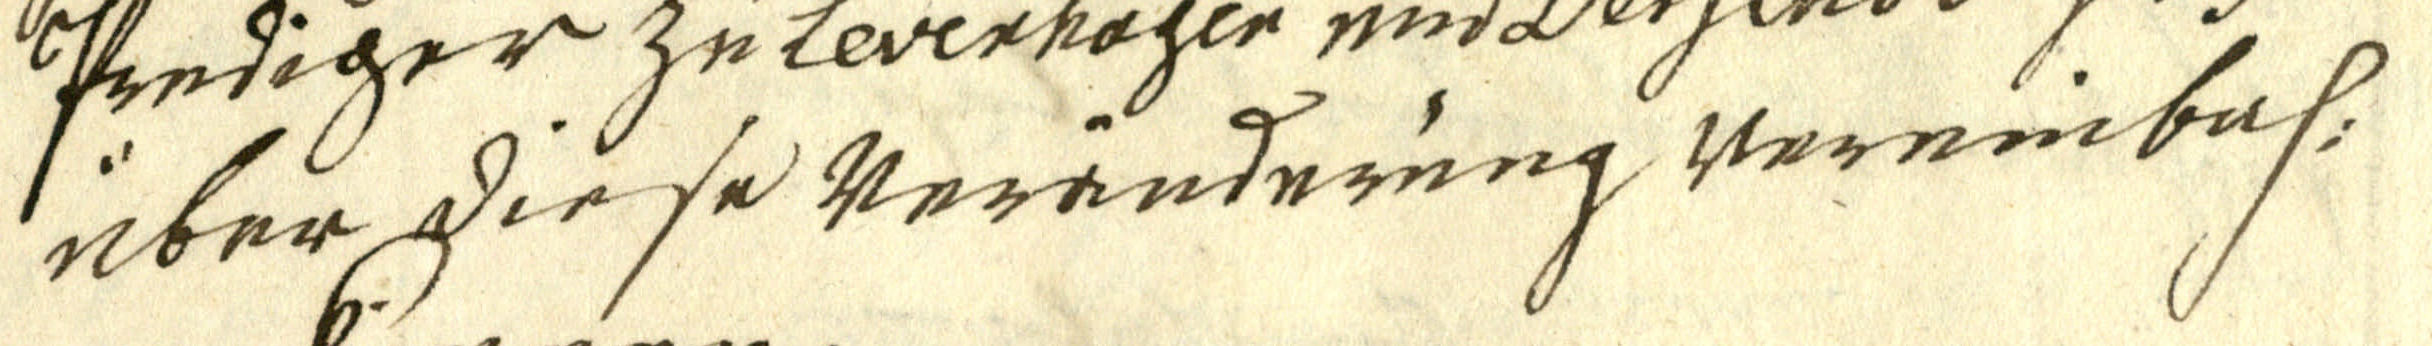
aber diese Veränderung vereinbah¬
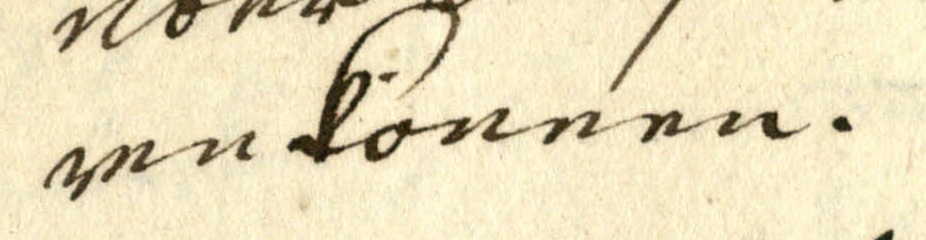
ren können.
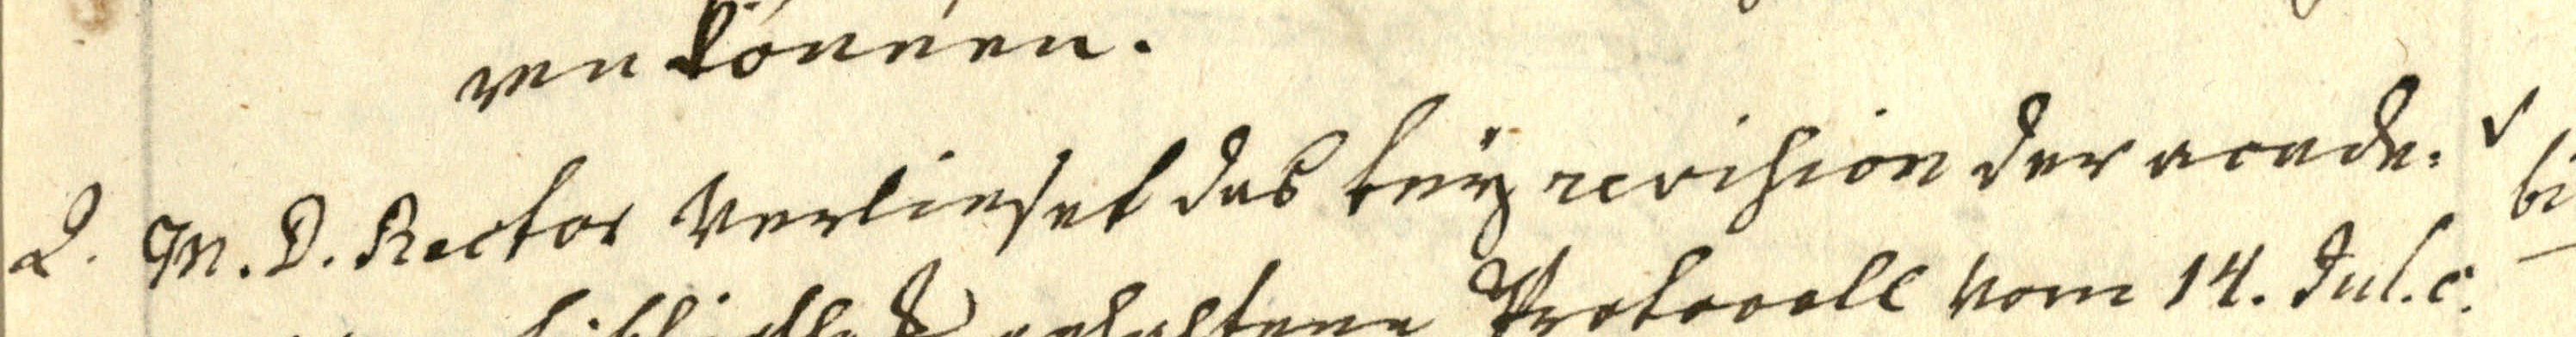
2. M. D. Rector verlieset das beÿ revision der acade¬
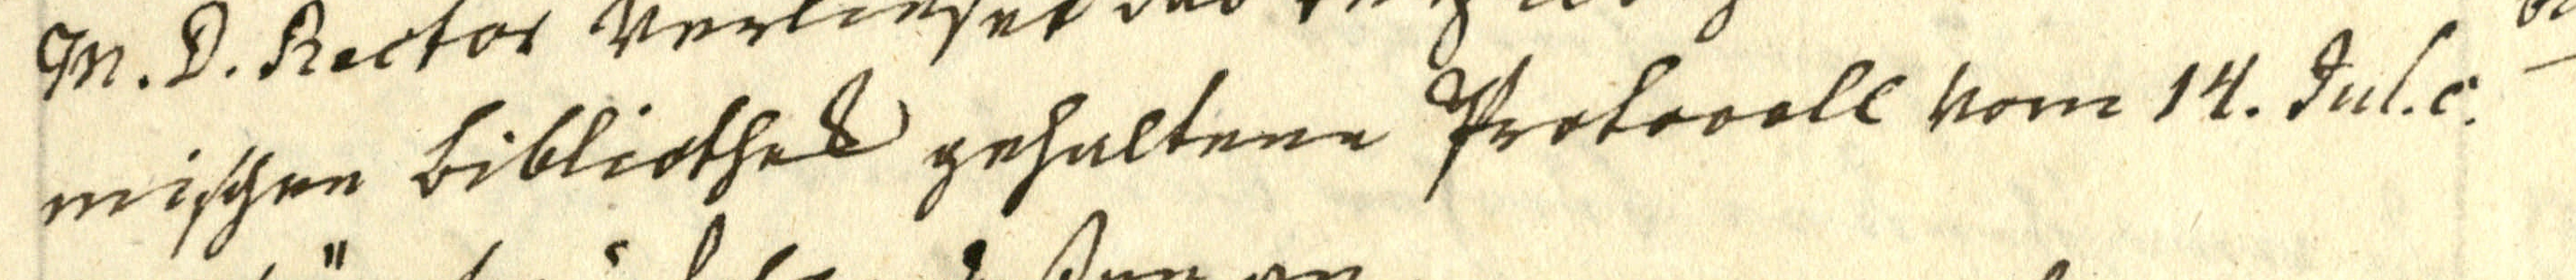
mischen Bibliothek gehaltene Protocoll vom 14. Jul.c.
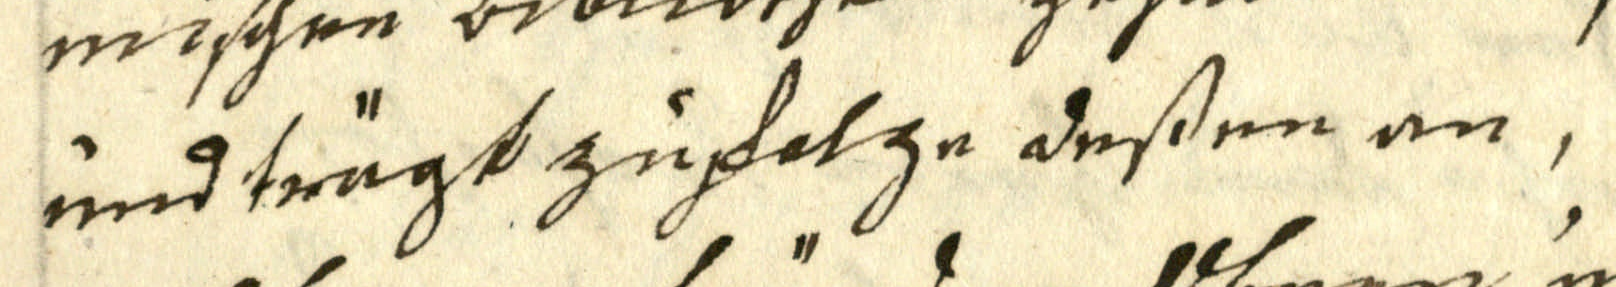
und trägt zufolge deßen an,
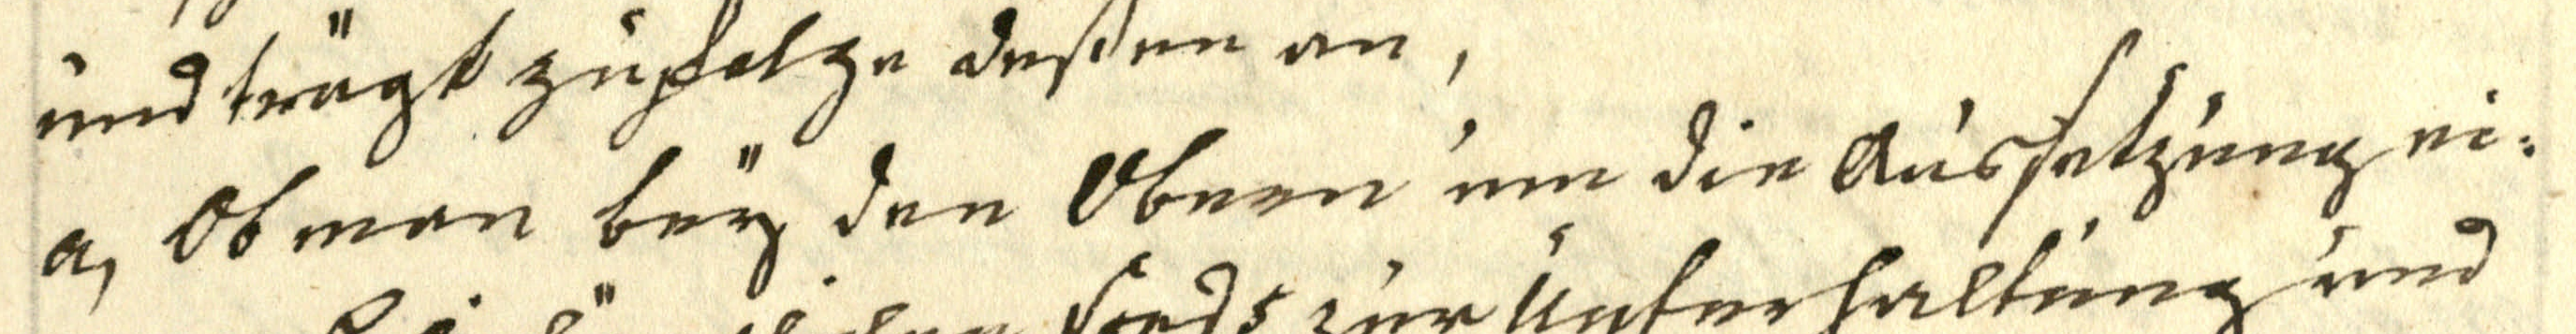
a, Ob man beÿ den Obern um die Aussetzung ei¬
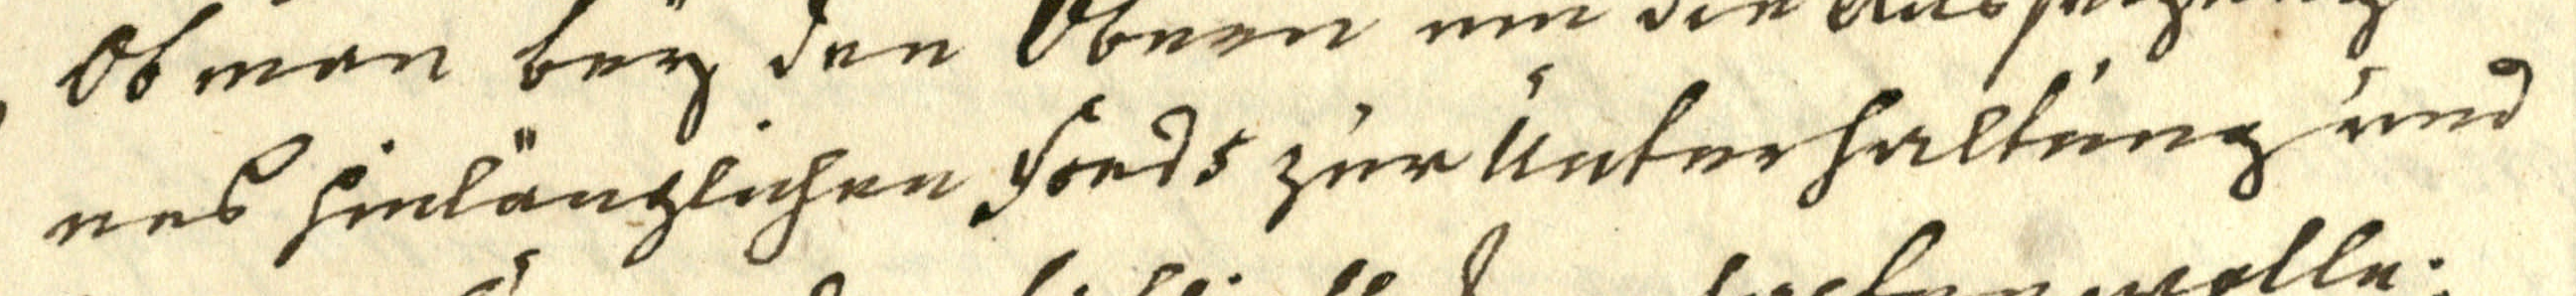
nes hinlänglichen Fonds zur Unterhaltung und
